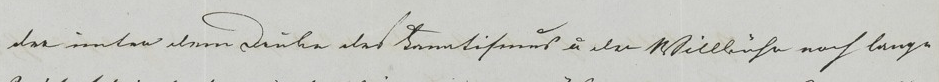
der unter dem Druke des Fanatismus u der Willkühr noch lange
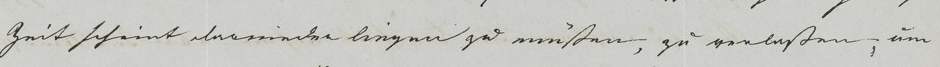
Zeit scheint darnieder liegen zu müßen, zu verlaßen, um
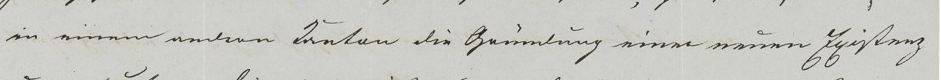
in einem andern Kanton die Gründung einer neuen Existenz
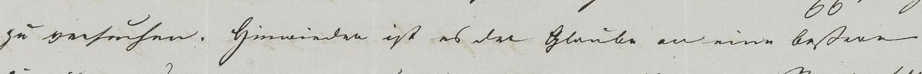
zu versuchen. Hinwieder ist es der Glaube an eine beßere
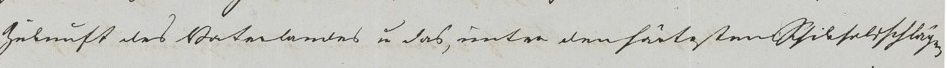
Zukunft des Vaterlandes u das, unter den härtesten Schiksalsschlägen
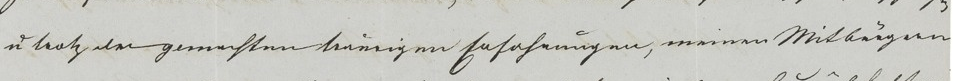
u trotz der gemachten traurigen Erfahrungen, meinen Mitbürgern
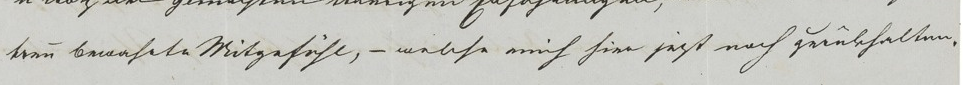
treu bewahrte Mitgefühl, – welche mich hier jezt noch zurükhalten.
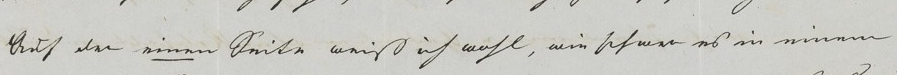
Auf der einen Seite weiß ich wohl, wie schwer es in einem
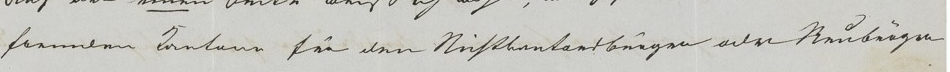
fremden Kantone für die Nichtkantonsbürger oder Neubürger
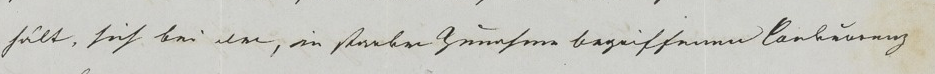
hält, sich bei der, in starker Zunahme begriffenen Conkurrenz
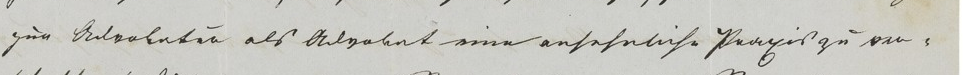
zur Advokatur als Advokat eine ansehnliche Praxis zu ver-
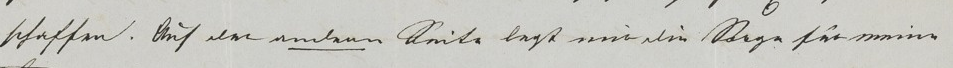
schaffen. Auf der andern Seite legt mir die Sorge für meine
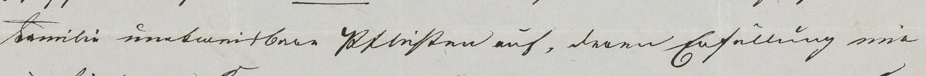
Familie unabweisbare Pflichten auf, deren Erfüllung mir
